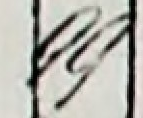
99
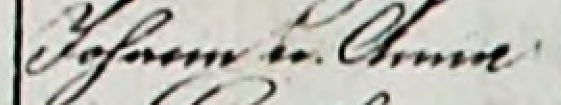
Johann u. Anna
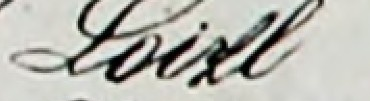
Loizl
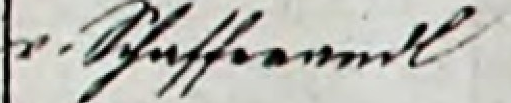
v. Schaffwandl
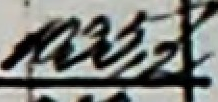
1035,2
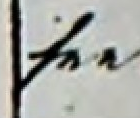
see
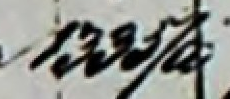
1335/a
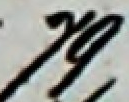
79
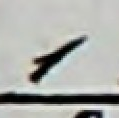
1
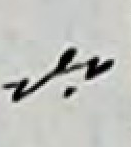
do
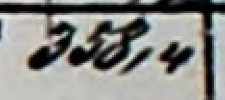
358,4
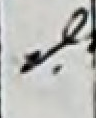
do
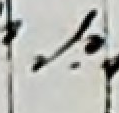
do
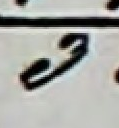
3
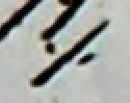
./.
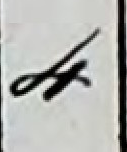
4
